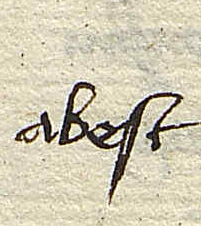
abeſt
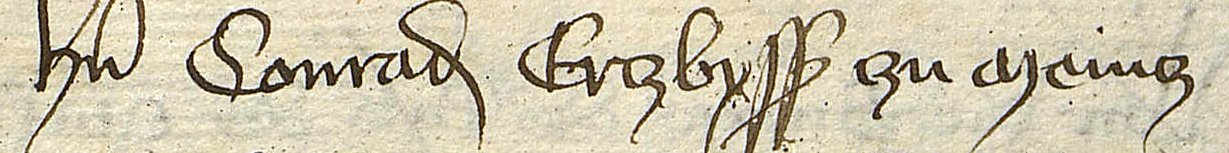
H*n Conrad* Ercʒbyſſ* cʒu Meincʒ
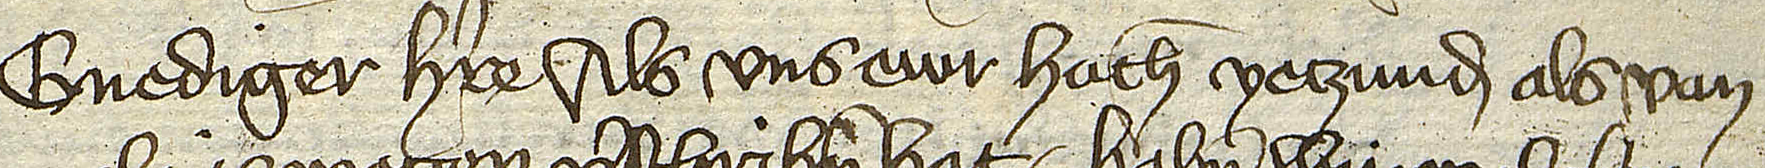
Gnediger h*re Als vns ewr hoch* yecʒund* als von
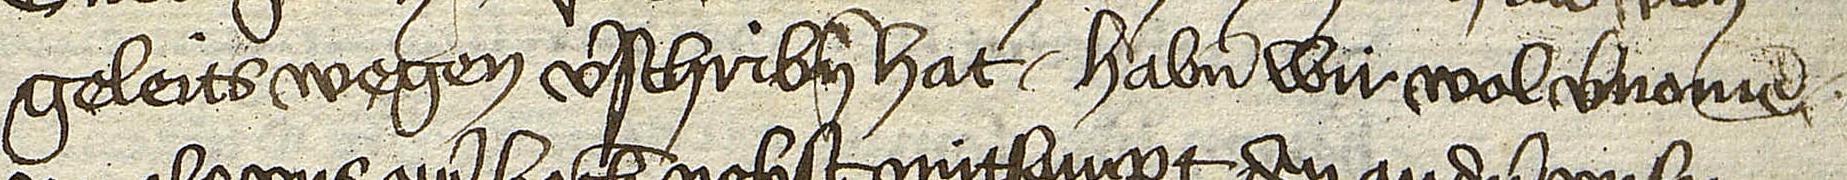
geleits wegen v*ſchrib*n hat / hab*n wir wol v*nome* / .
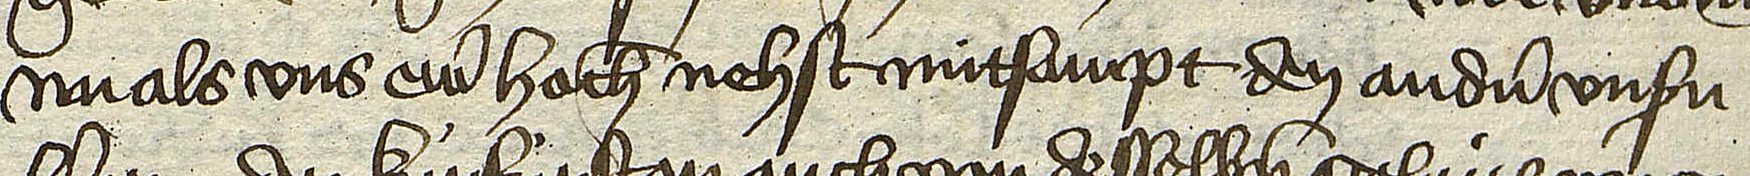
Nu als vns ew* hoch* nehſt mitſampt den and*n vnſ*n
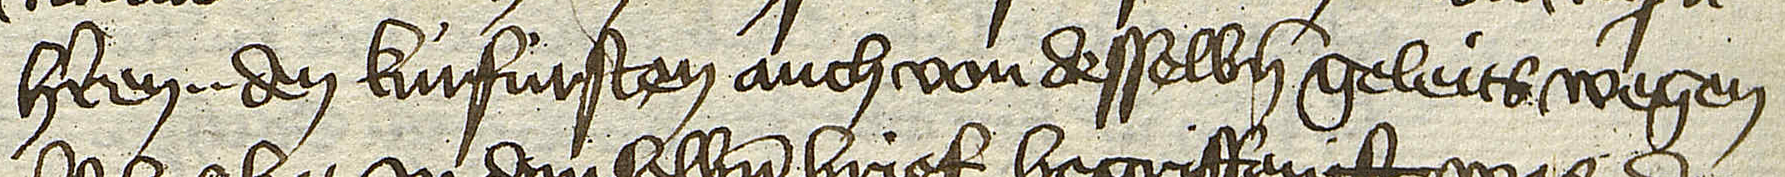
h*ren ~ den kürfürſten auch von deſſelb*n geleits wegen
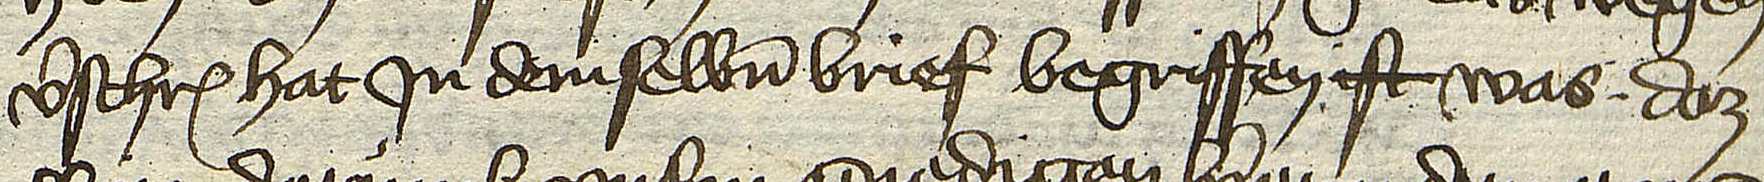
v*ſchr* hat In demſelb*n brief begriffen iſt was . daʒ
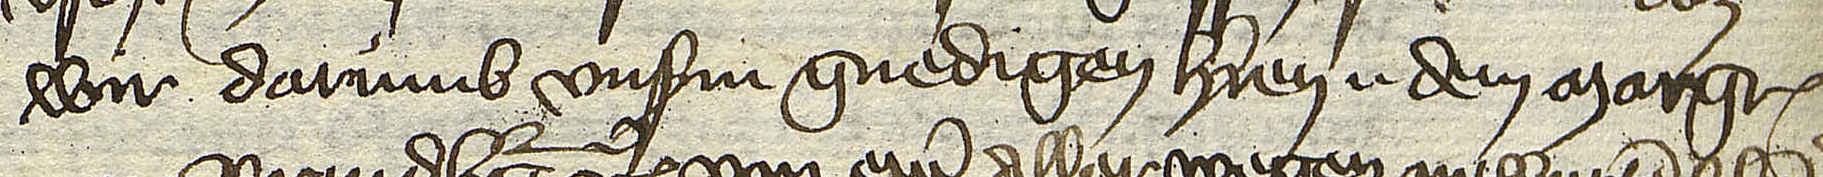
wir darümb vnſ*m gnedigen h*ren ~ dem Margr*
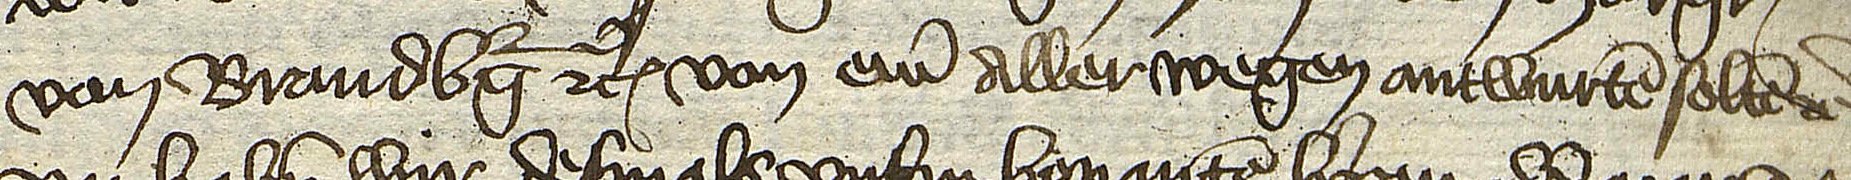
von Brand*b*g ec* von ew* Aller wegen antwurte* ſolte* ec*
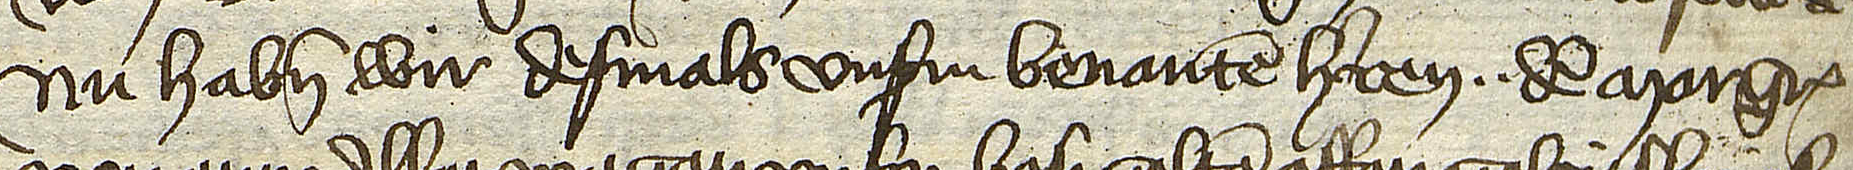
Nu hab*n wir deſmals vnſ*m benante* h*ren ~ de* Margr*
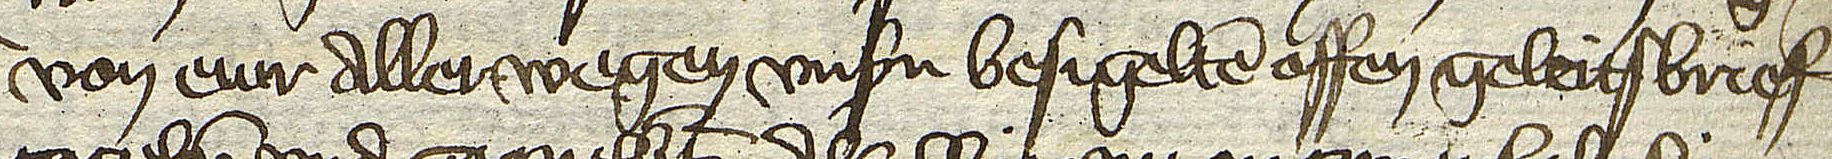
von ewr Aller . wegen vnſ*n beſigelte* offen geleitſbrief
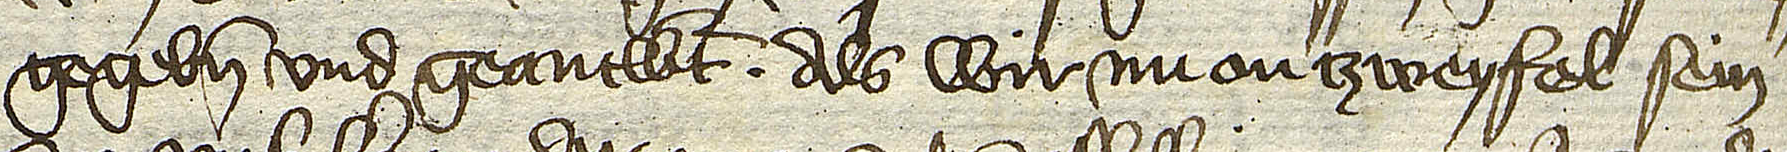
gegeb*n vnd geantw*t . Als wir nu on cʒweyfel ſein
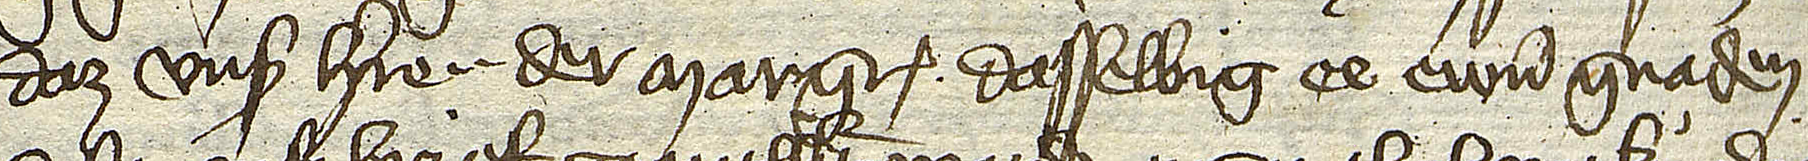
daʒ vnſ* h*re ~ der Margr* . daſſelbig ee ew*n gnaden
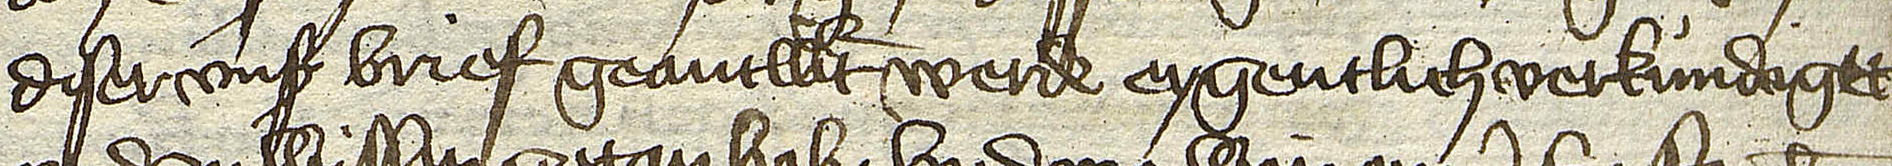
diſer vnſ* brief geantw*t werde eygentlich verkündiget
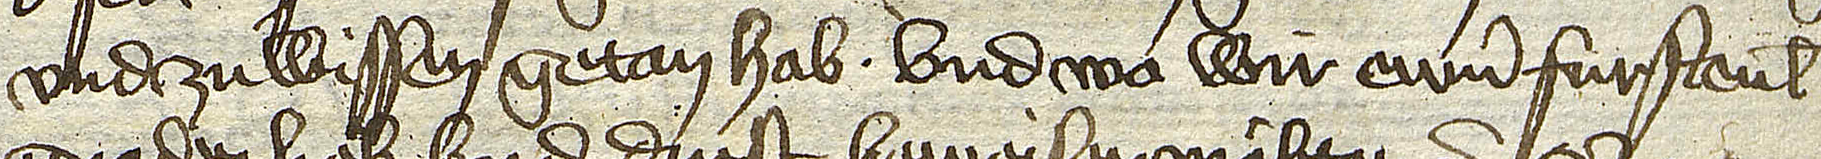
vnd cʒu wiſſen getan hab . vnd wo wir ew*n furſtenl*
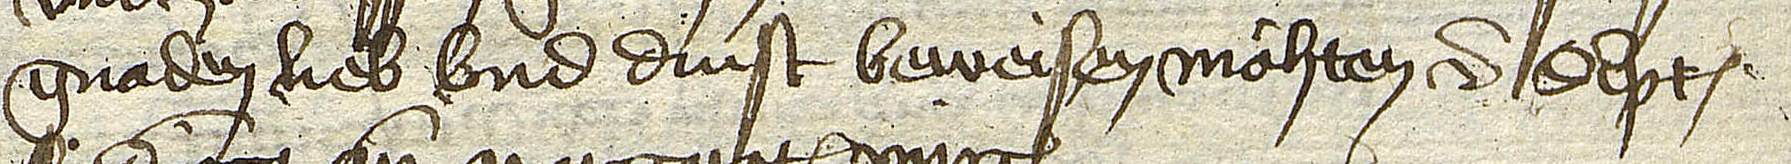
gnaden lieb vn dinſt beweiſen möchten ec* Sc*pt*
